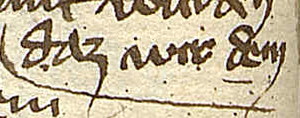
daʒ wir dem
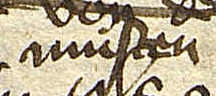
müſten
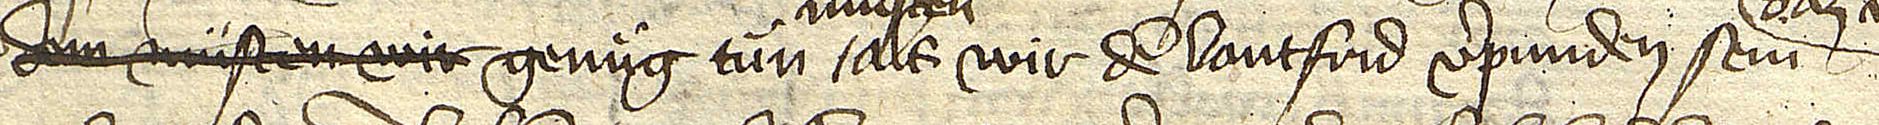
dem müſten wir genüg tün / als wir d* lantfrid v*punden ſein
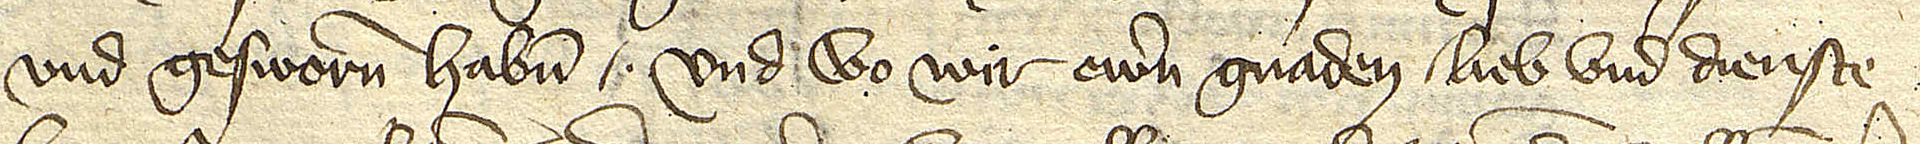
vnd geſworn* habn* /. vnd wo wir ew*n gnaden / lieb vnd dienſte
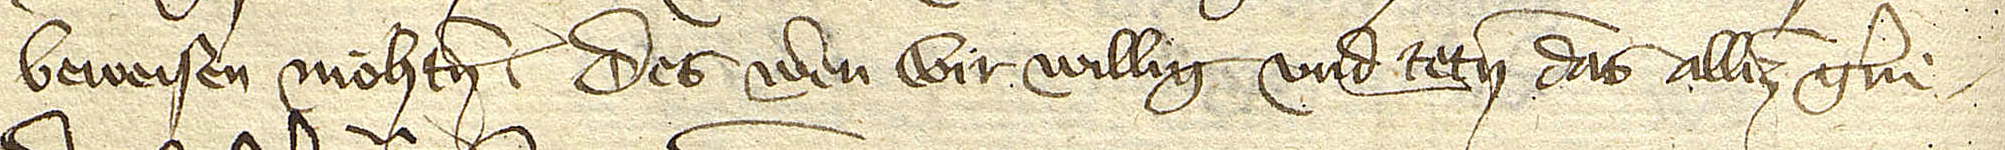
beweiſen möhtn* / Des w*en wir willig vnd tetn* das allcʒ* g*ne /
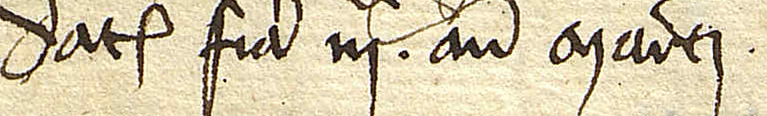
Dat* fia* iii* . an* Marti*
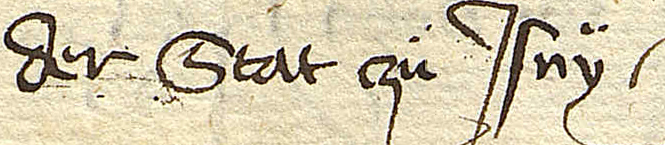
der Stat cʒu Iſny /
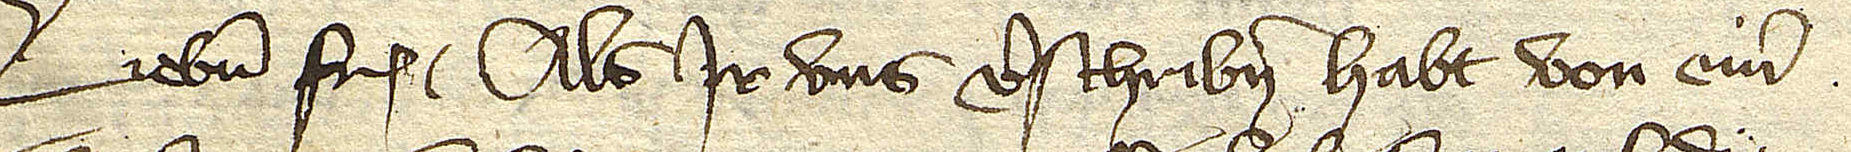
Liebn* fr* / Als Ir vns v*ſchribn* habt von ein*
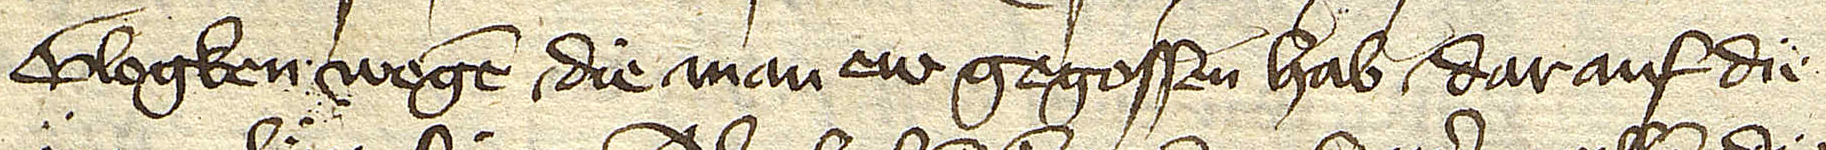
Glogken wege* / die man ew gegoſſen hab / darauf die
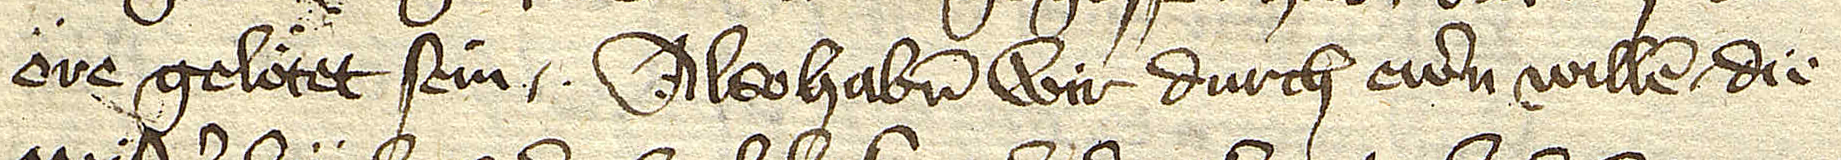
%re gelötet ſein /. Also habn* wir durch ew*n wille / die
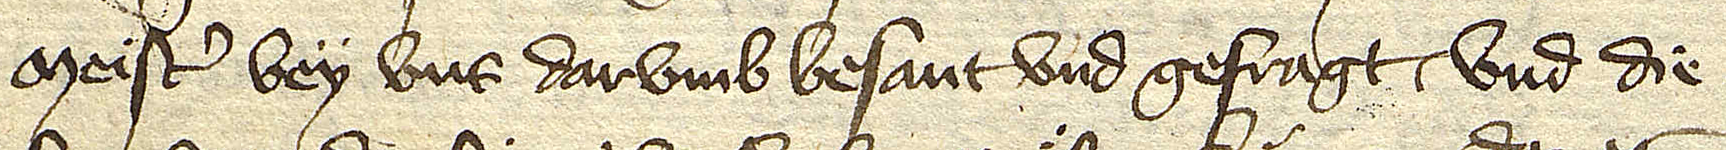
Meiſt* bey vns darvmb beſant vnd gefragt / vnd die
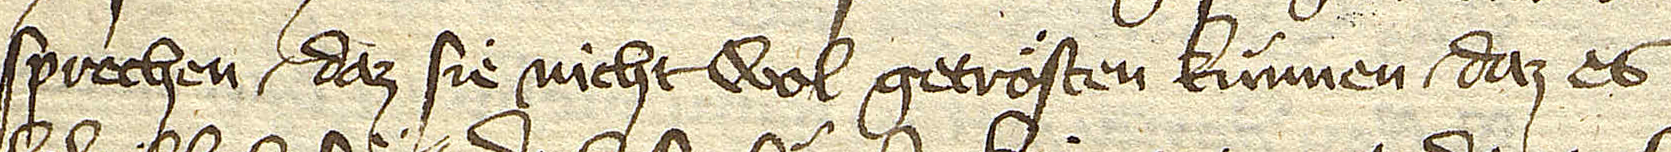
ſprechen / daʒ ſie nicht wol getröſten künnen / daʒ es
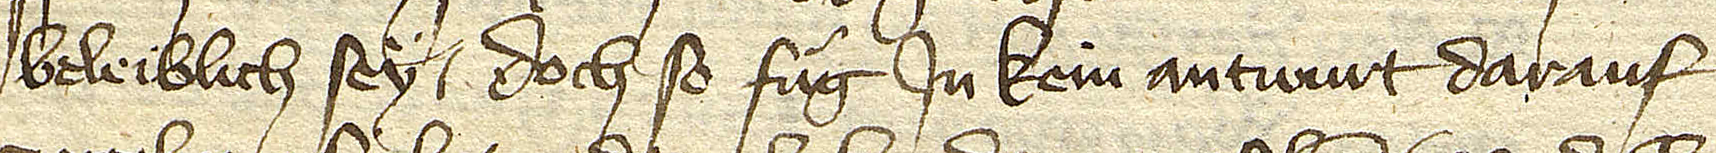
beleiblich ſey / doch ſo füg In kein antwurt darauf
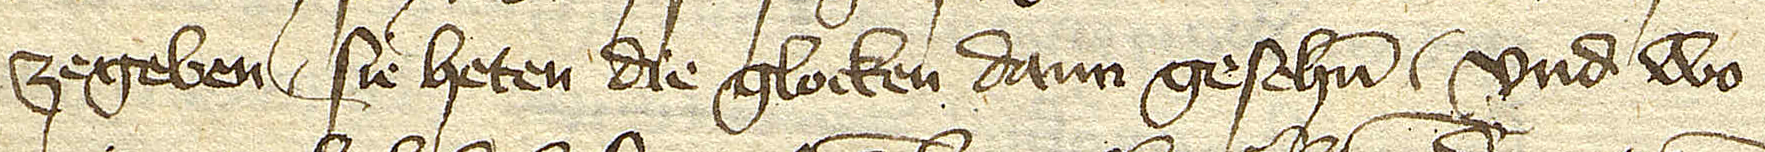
cʒegeben / ſie heten die glocken dann geſehn* / vnd wo
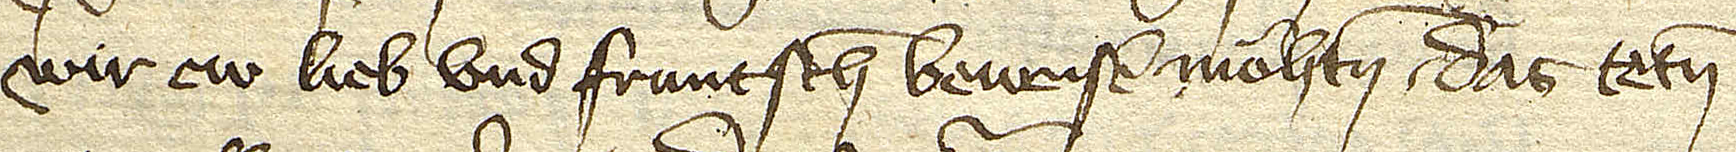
wir ew lieb vnd fruntſch* beweiſe* möhtn* / das tetn*
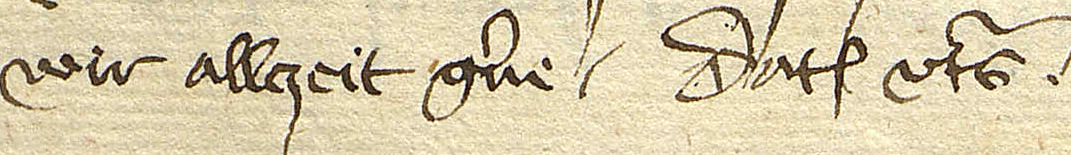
wir allcʒeit g*ne / Dat* vts* .
